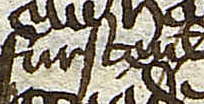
furſtenl*
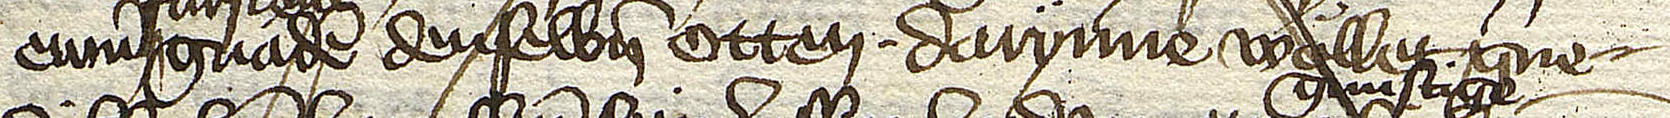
ewn* gnade* denſelb*n Otten . darynne wöllet . gne =
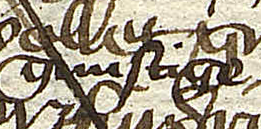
gunſtige
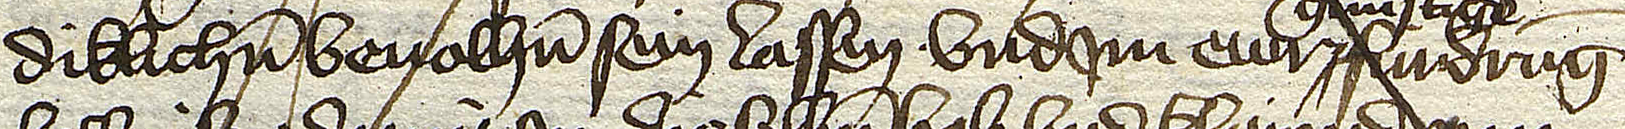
diklich*n beuolh*n ſein laſſen . vnd Im ewr fürdru*g
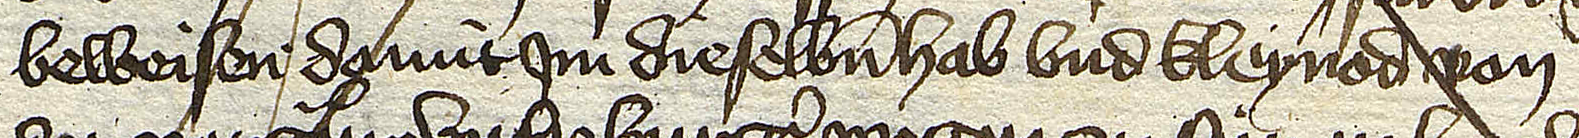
beweiſen damit Im dieſelb*n hab vnd kleynod von
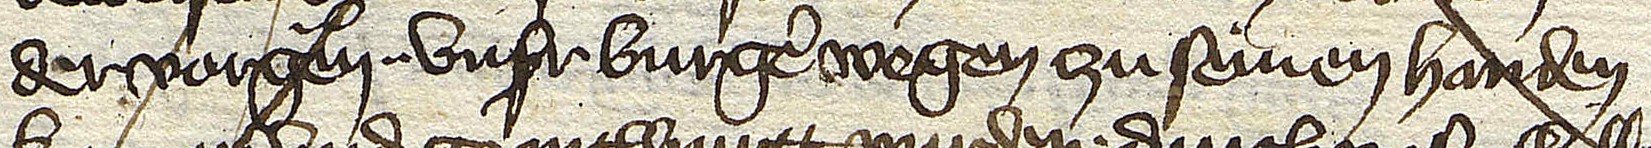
der vorgen* ~ vnſ*r burge* wegen cʒu ſeinen handen
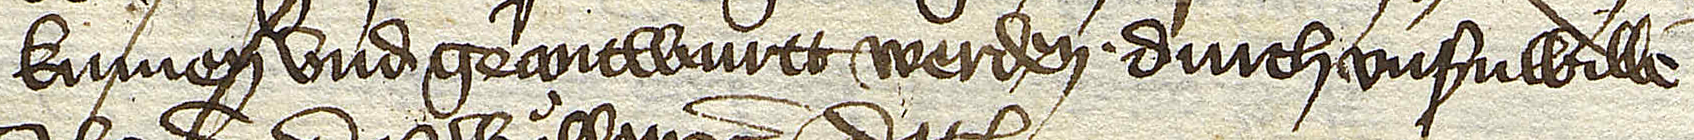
kumen vnd geantwurt werden . durch vnſ*n wille*
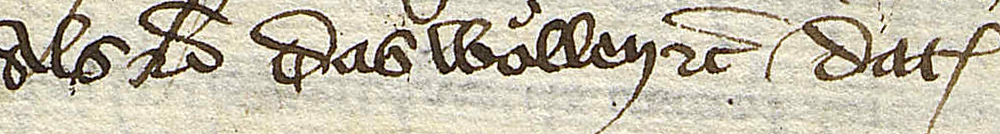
Als ec* das wöllen ec* / dat*
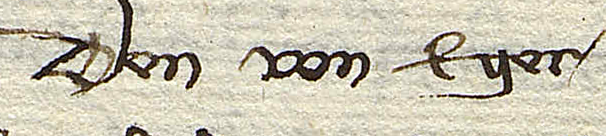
Den von Eger
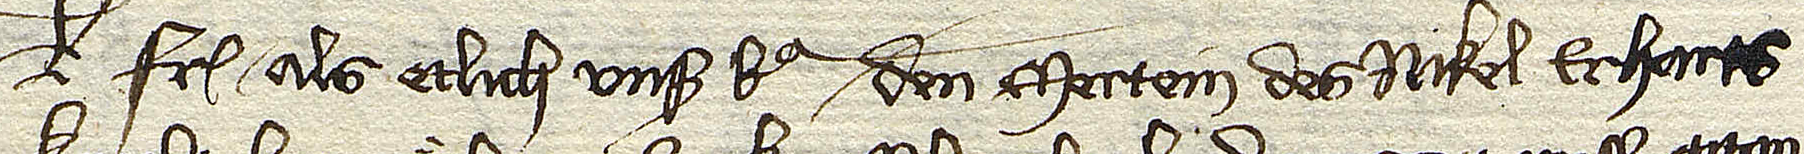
L* fr* / als etlich vnſ* b* / den Mertein des Nikel Erharts
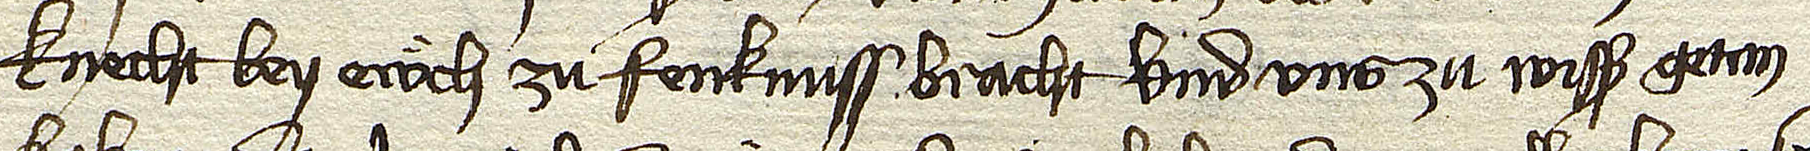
knecht bey ewch ʒu fenknuſſ bracht Vnd vns ʒu wiſſ* getan
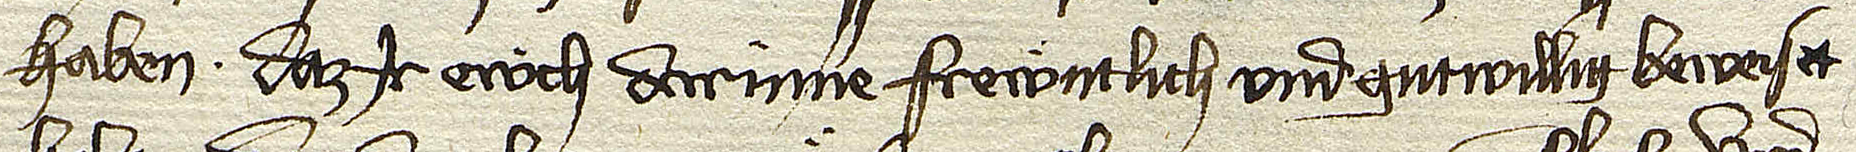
haben . daʒ Ir ewch darinne frewntlich vnd gutwillig beweiſt
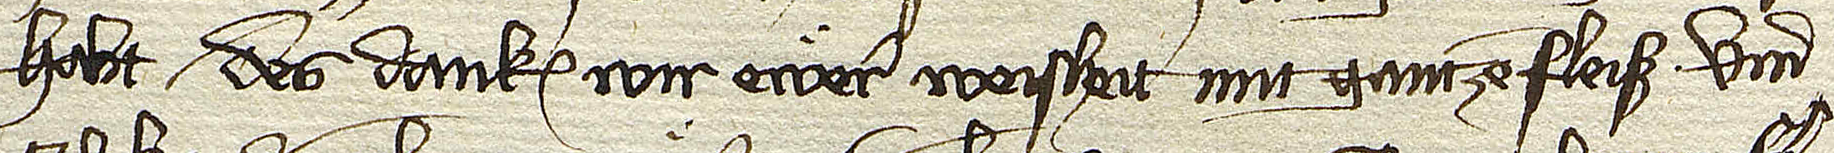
habt / Des dank* wir ewer* weiſheit mit gancʒe* fleiſʒ Vnd
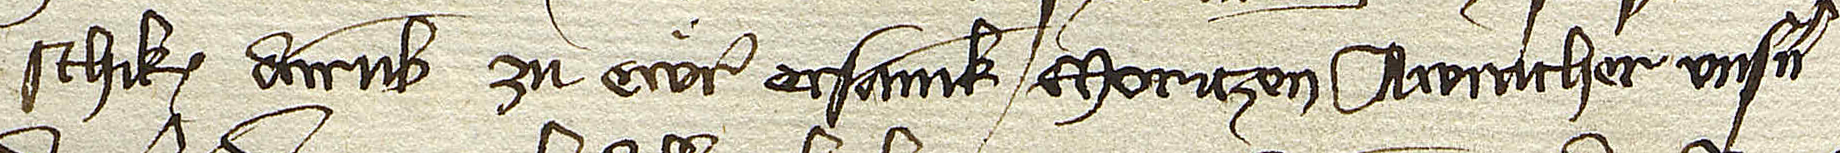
ſchik* daru*b ʒu ew*r erſamk* Moricʒen Awracher vnſ*n
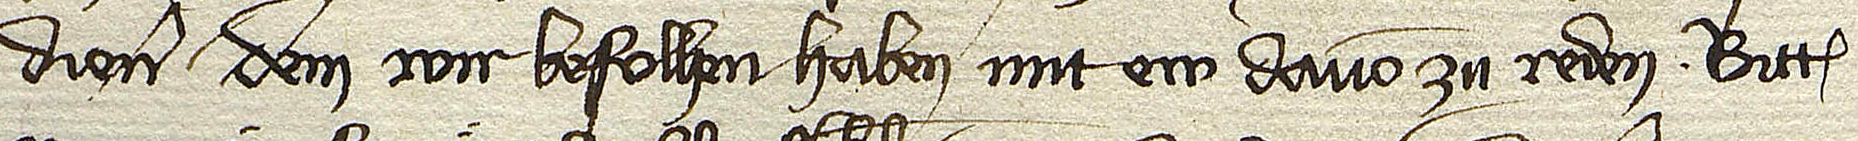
dien* / Dem wir befolhen haben mit ew dauo* ʒu reden . Bitt*
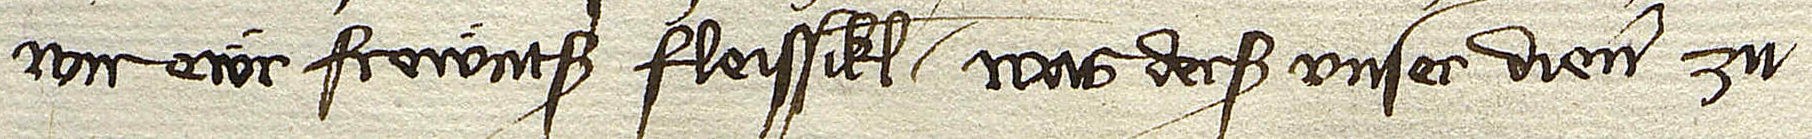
wir ewr frewntſ* fleiſſikl* / was derſ* vnſer dien* ʒu
